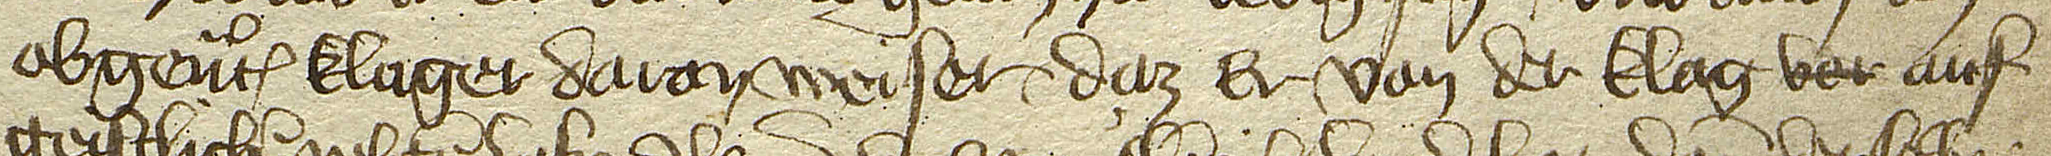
obgent* klager daran weiſer / daʒ Er von der klag v%r auf
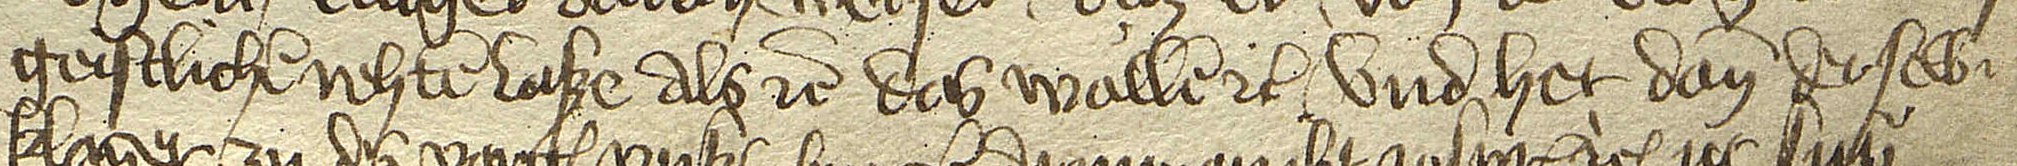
geiſtliche* rehte* laſʒe Als ec* das wölle* ec* vnd het dan* derſelb ~
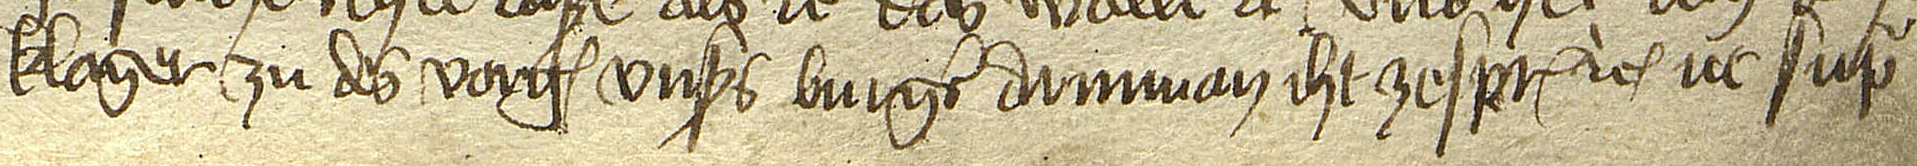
klag* cʒu des vorg* vnſ*s burgs* Armman iht ʒeſpr* ec* ut ſup*
